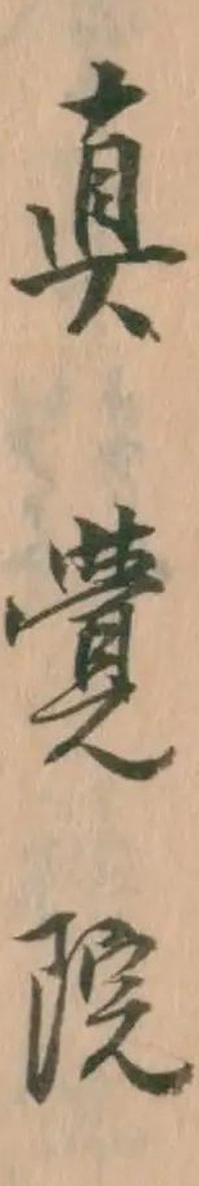真覚院
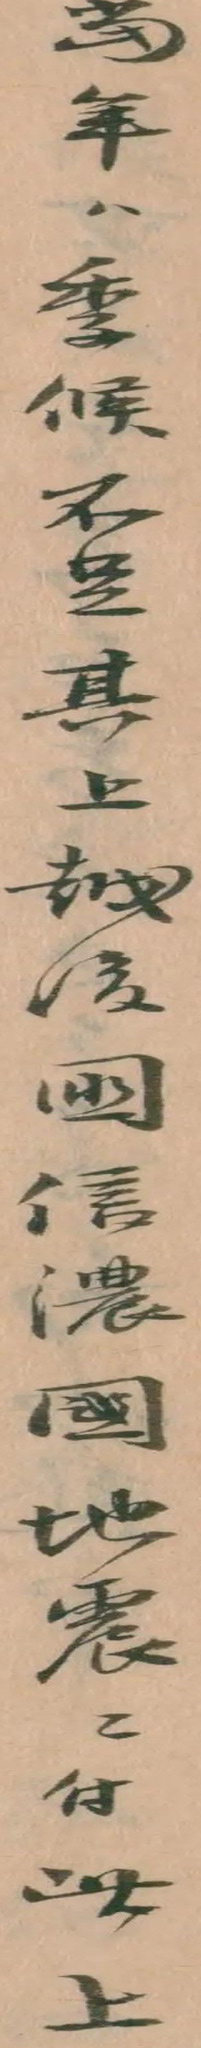当年ハ季候ふ不足其上越後国信濃国地震二付此上
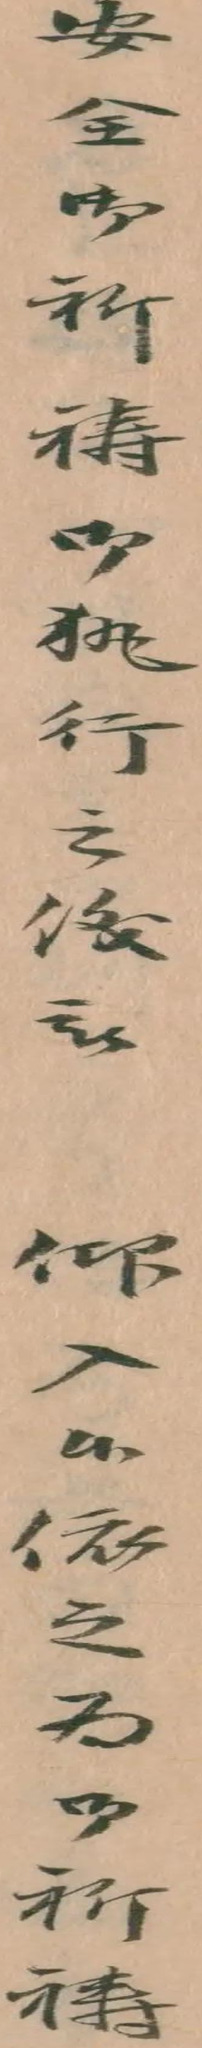安全御祈祷御執行之儀被仰入候依之為御祈祷
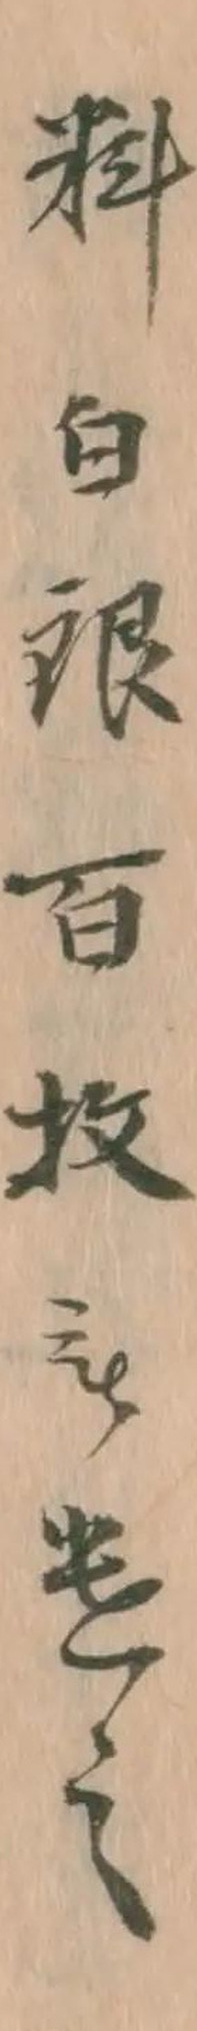料白銀百枚被遣候
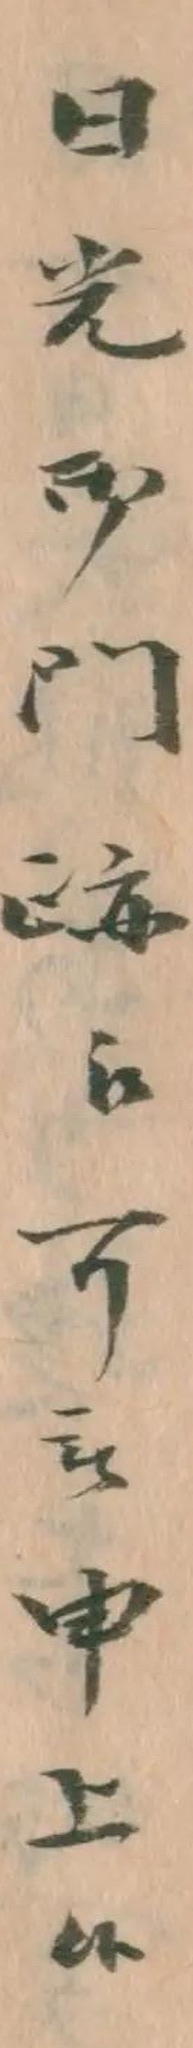日光御門跡江可被申上候
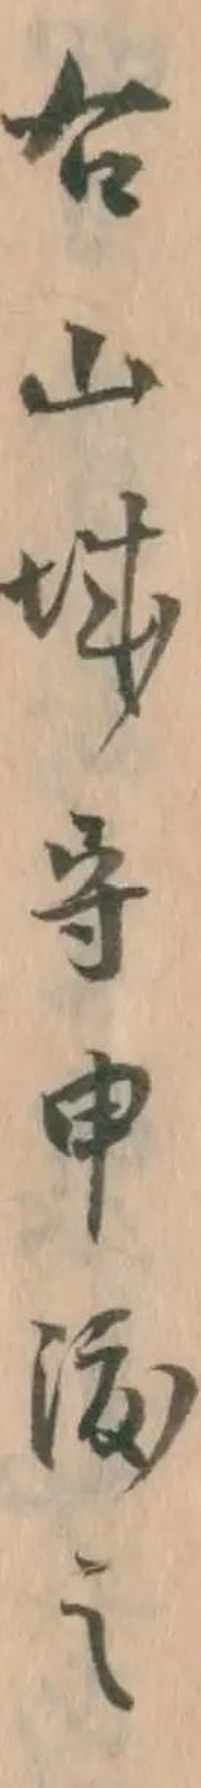右山城守申渡之
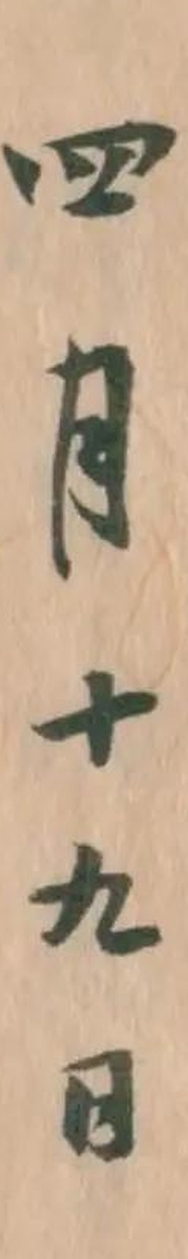四月十九日

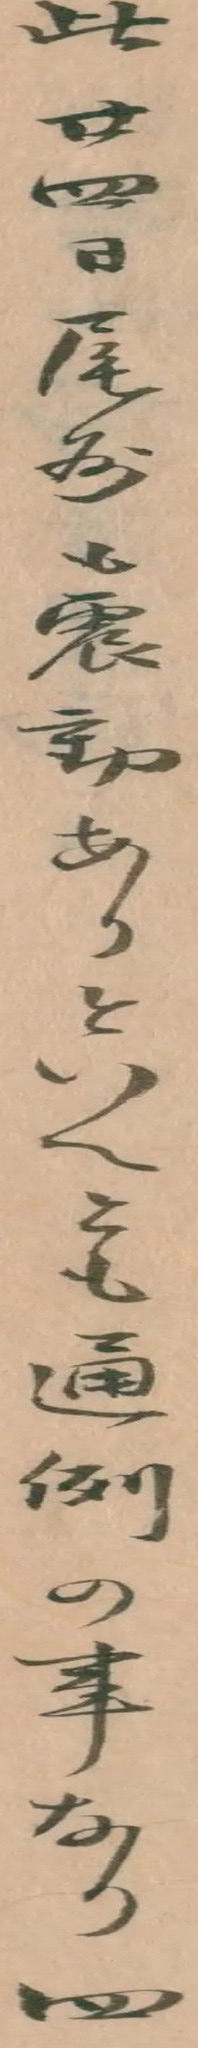此廿四日尾州も震動ありといへとも通例の事なり
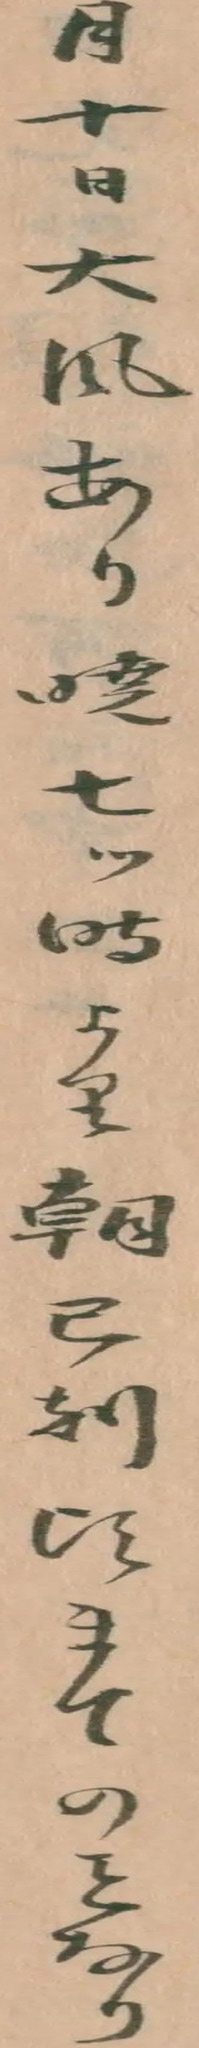四月十日大風あり暁七ッ時より朝巳刻頃まてのことなり
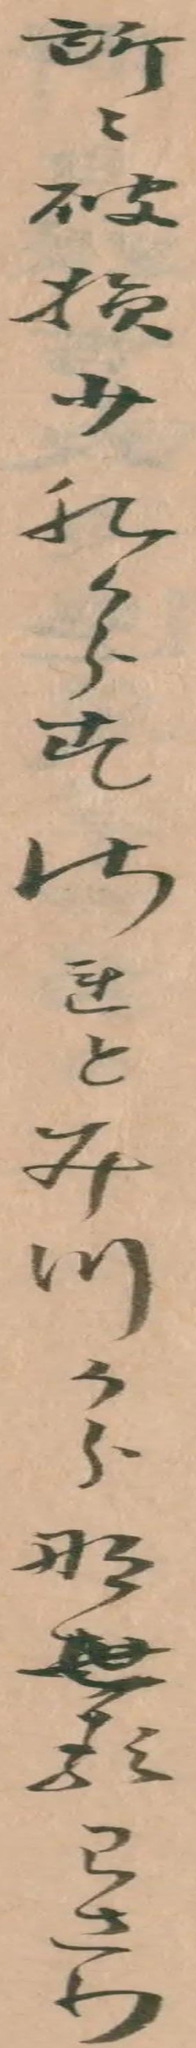所々破損少ならす御れとミつからなせるわさわ
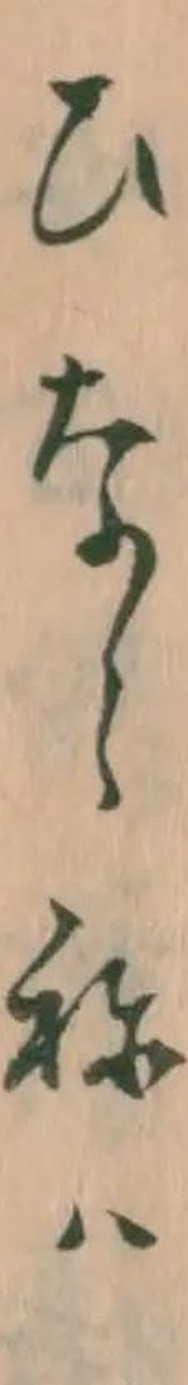ひならねハ
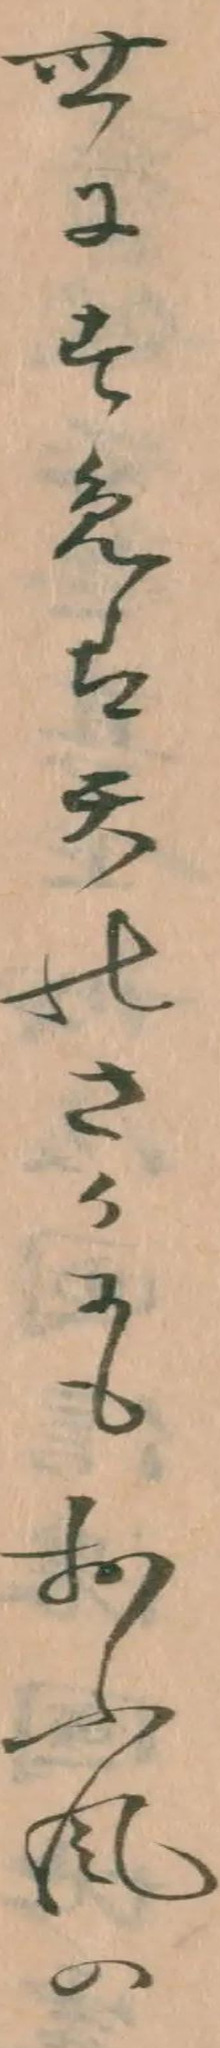世にすめハ天のさかにもあふ風の
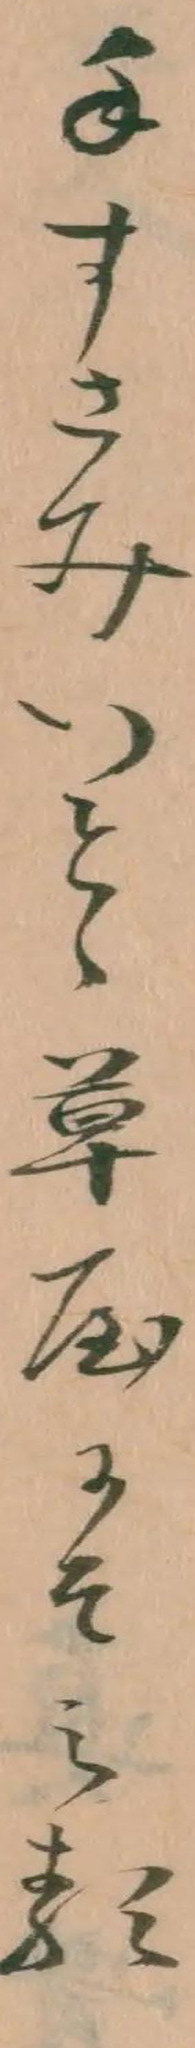手すさみいとゝ草屋にそみる
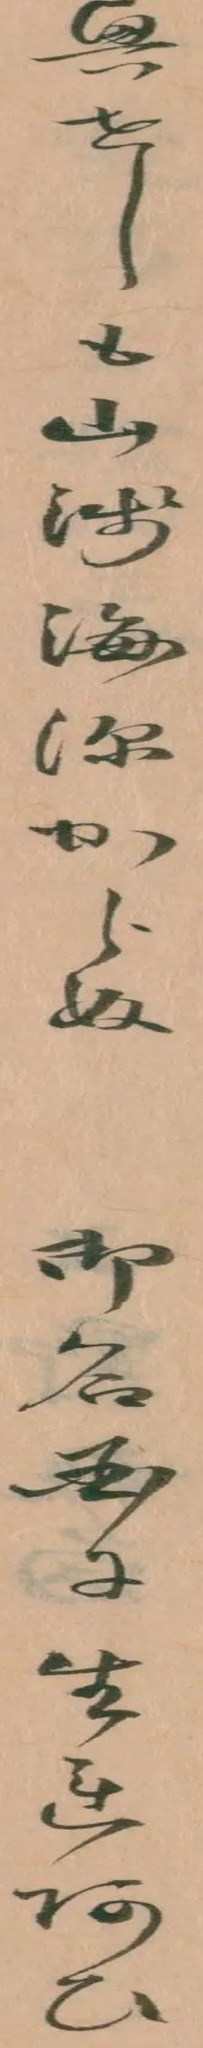興をしも山浅海深からぬ御名国に生れあひ
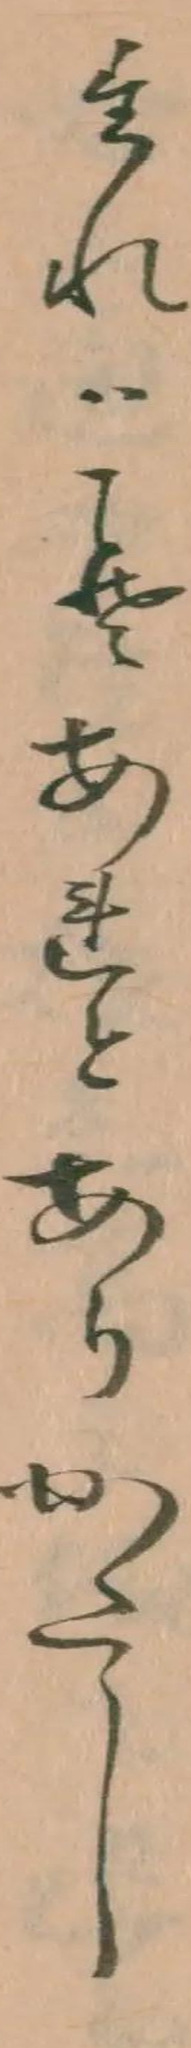たれはにそあれとありかたし
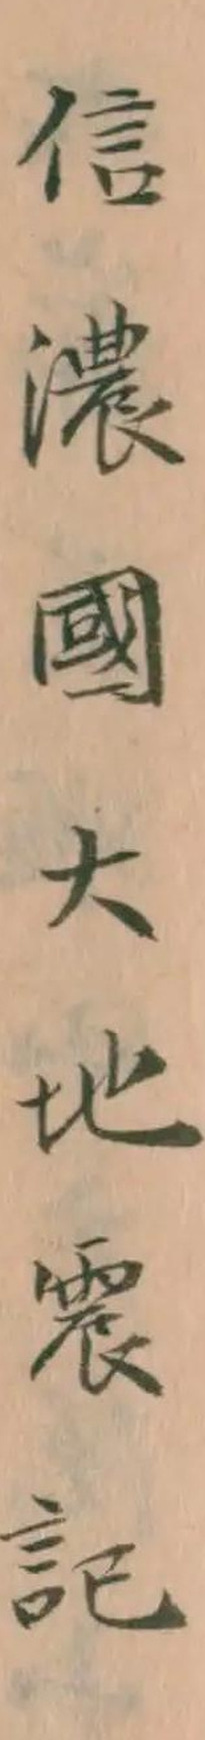信濃国大地震記
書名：地災撮要. 巻3(地震之部)-巻4(噴火之部)
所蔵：国立国会図書館 National Diet Library, JAPAN
